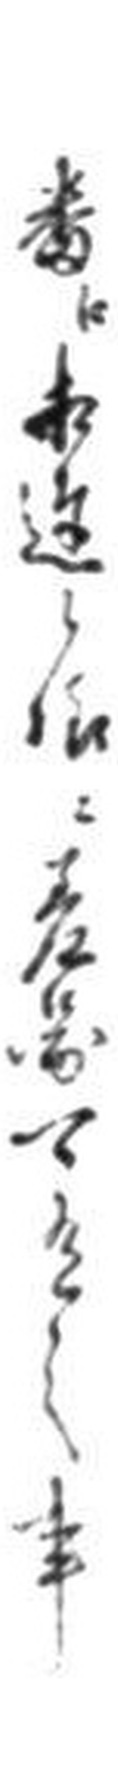番江相達候様ニ差図可有之事
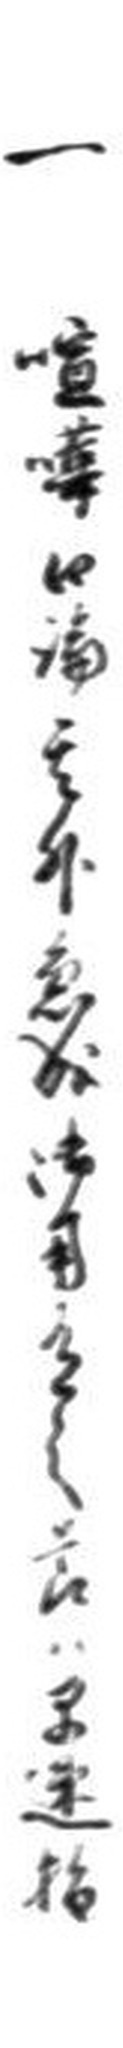一喧嘩口論其外急成御用有之節ハ早速指
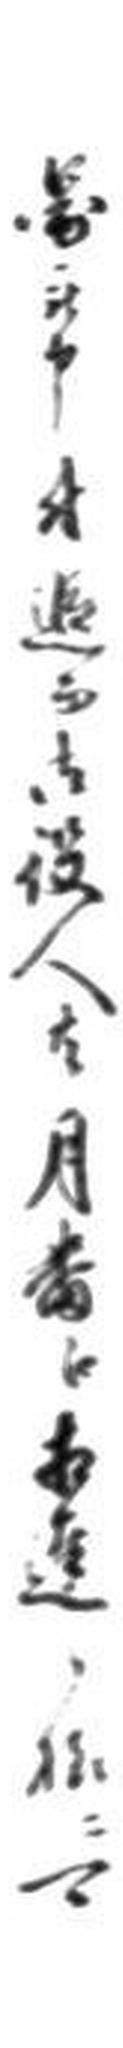図被申付追而御役人共月番江相達候様ニ可
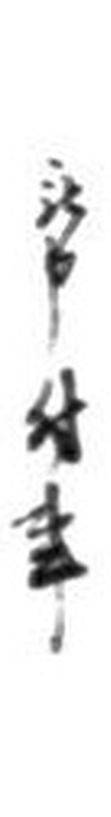被申付事
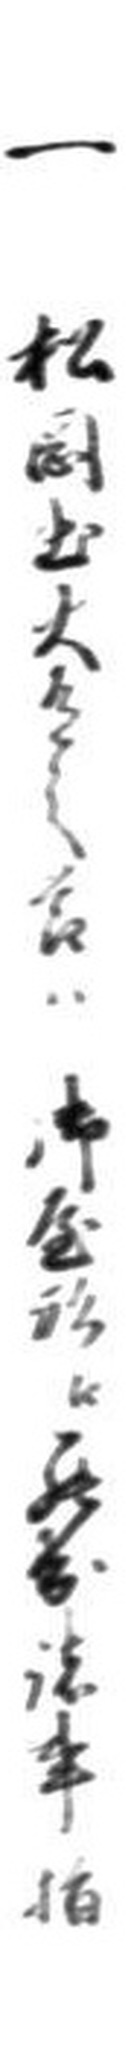一松岡出火有之節ハ御屋形江罷出諸事指
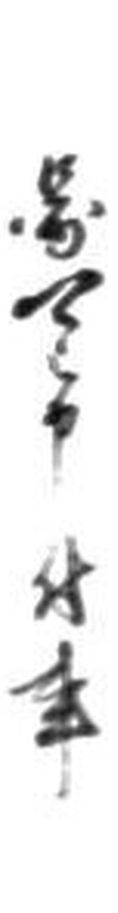図可被申付事
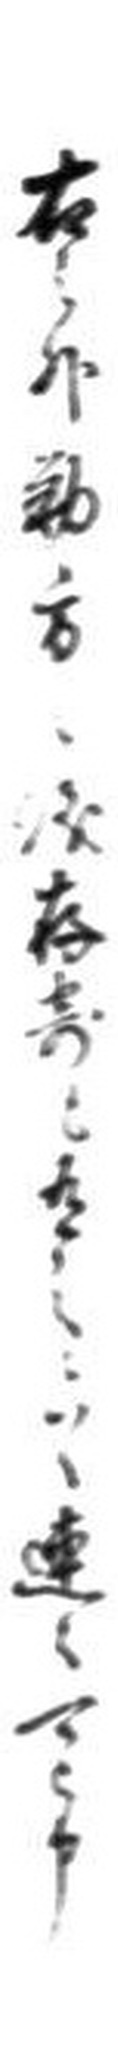右之外勤方之儀存寄も有之候ハヽ連々可被申
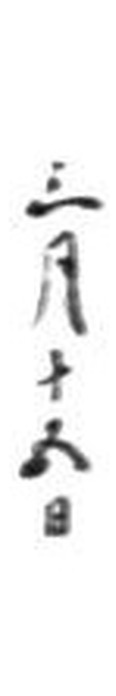三月十五日

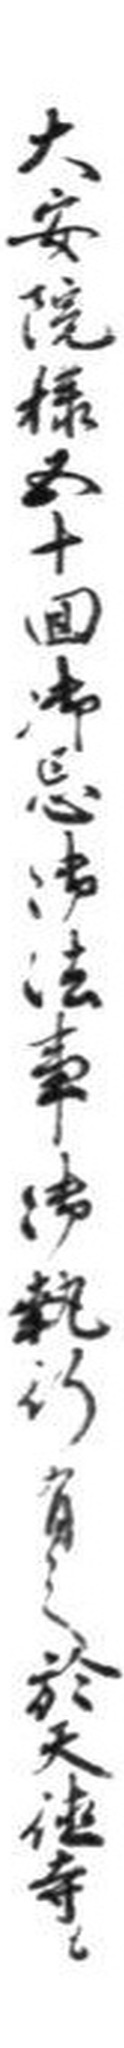大安院様五十回御忌御法事御執行有之於天徳寺も
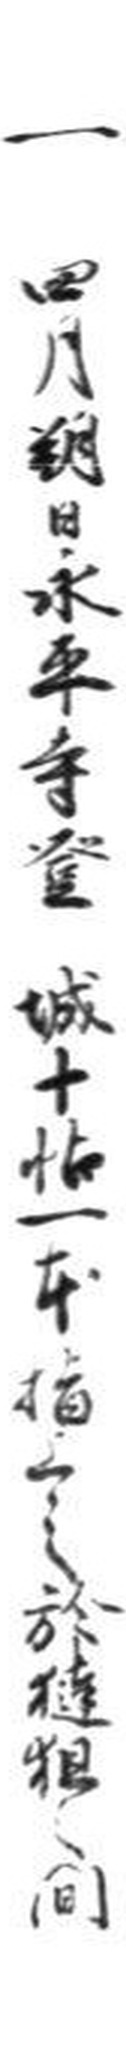一四月朔日永平寺登城十帖一本指上之於韃靼之間
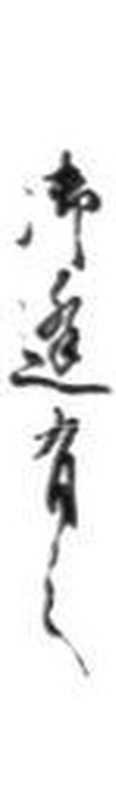御逢有之
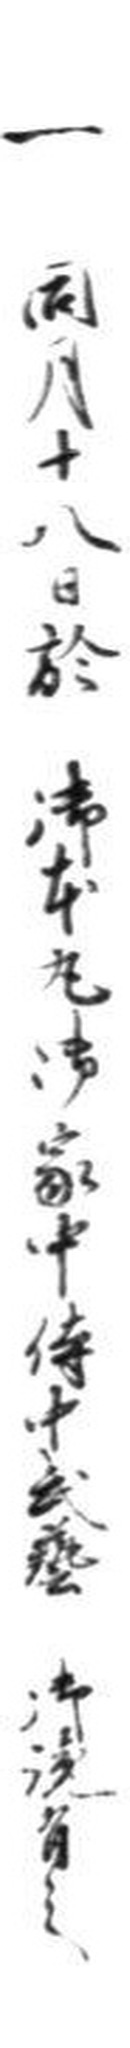一同月十八日於御本丸御家中侍中武芸御覧有之
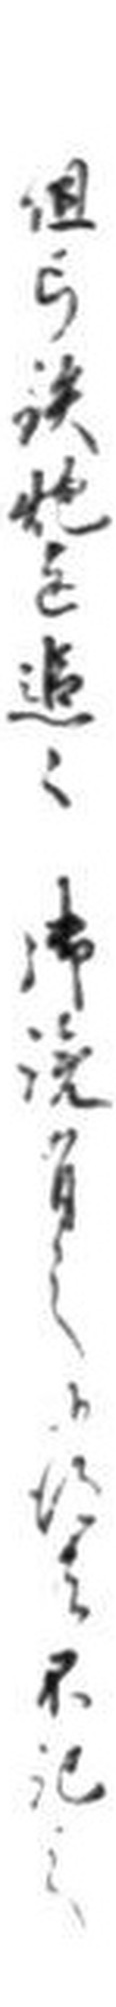但弓鉄炮迄追々御覧有之候得者不記之
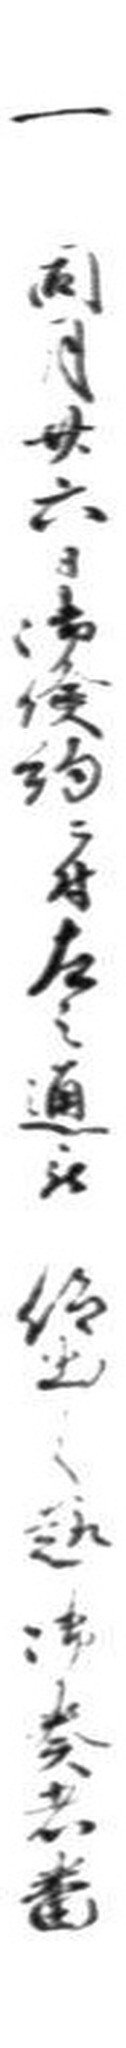一同月廿六日御倹約ニ付左之通被仰出之趣御奏者番
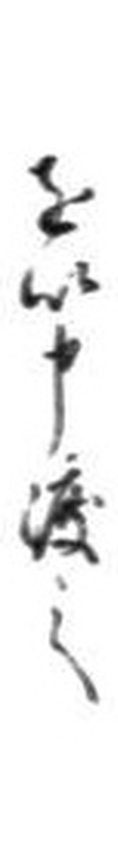を以申渡之
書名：家譜 三十六 宗昌公 従享保八年到同九年
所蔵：福井県文書館 Fukui Prefectural Archives
